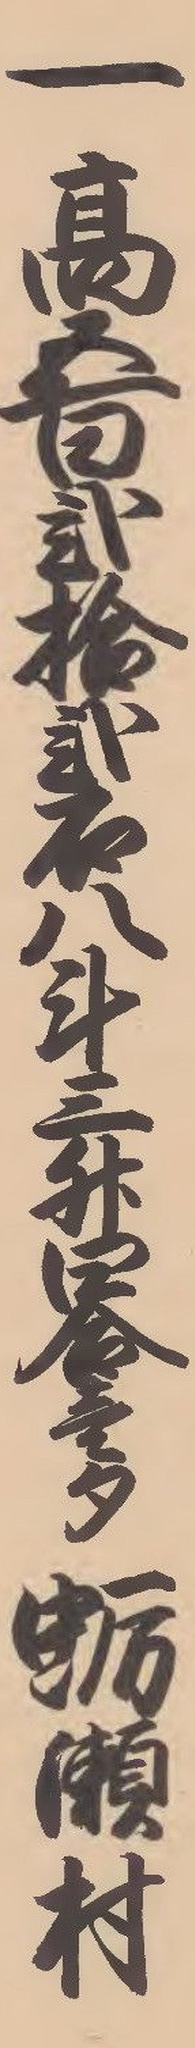一髙五百弐拾弐石八斗三升四合壱夕蛎瀬村
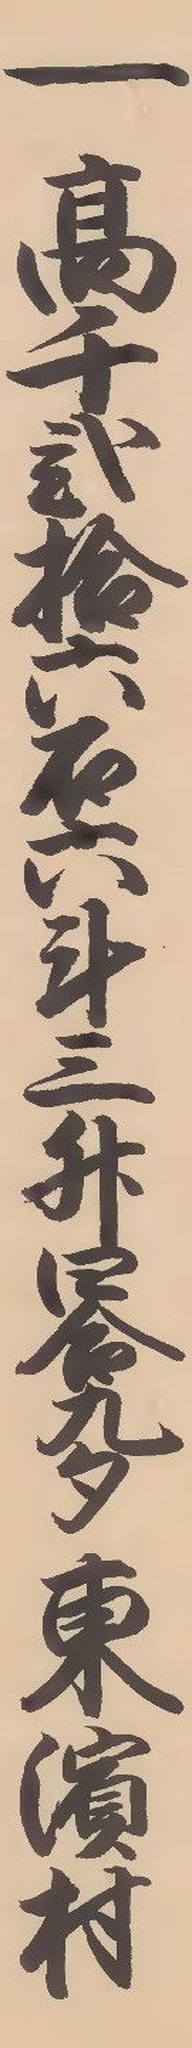一髙千弐拾六石六斗三升四合九夕東濱村
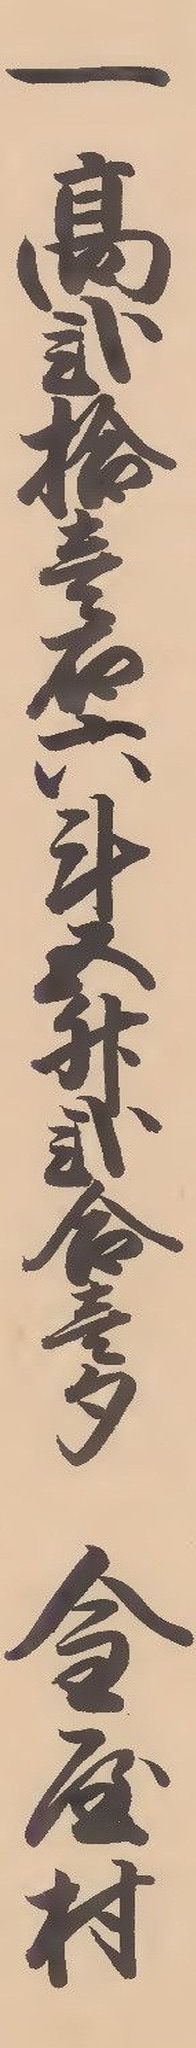一髙弐拾壱石六斗五升弐合壱夕金屋村

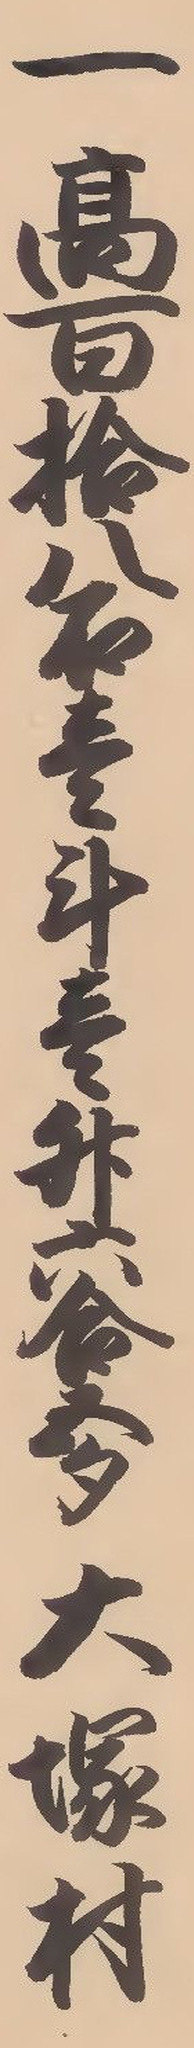一髙百拾八石壱斗壱升六合五夕大塚村
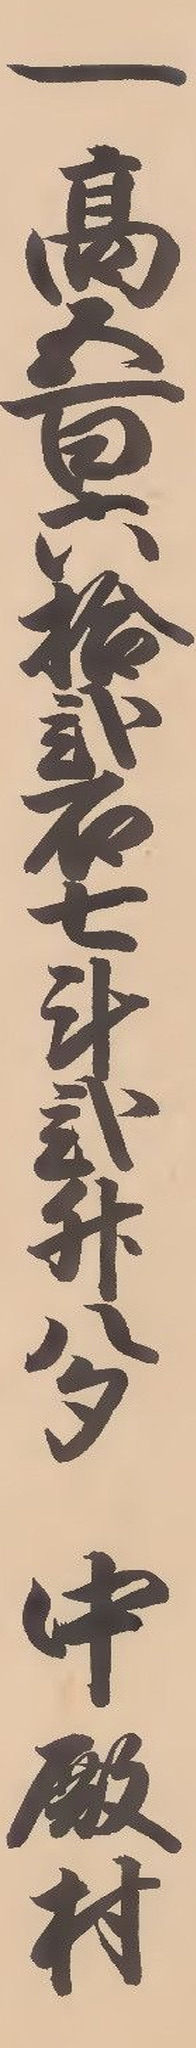一髙五百六拾弐石七斗弐升八夕中殿村
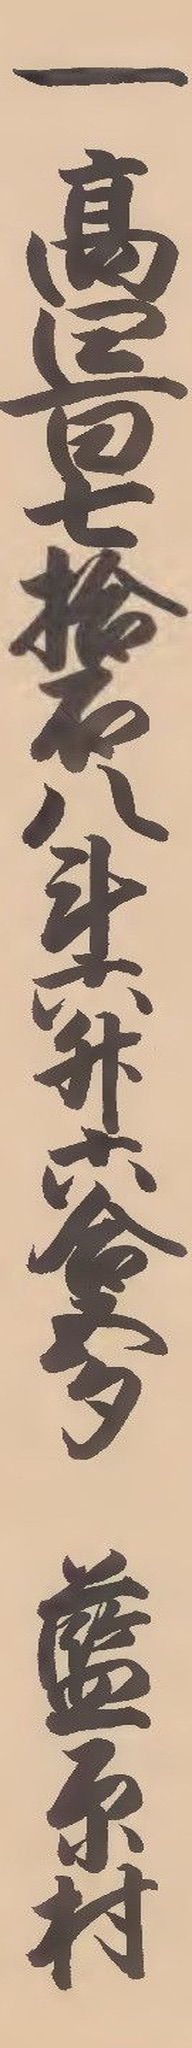一髙四百七拾石八斗六升六合五夕藍原村
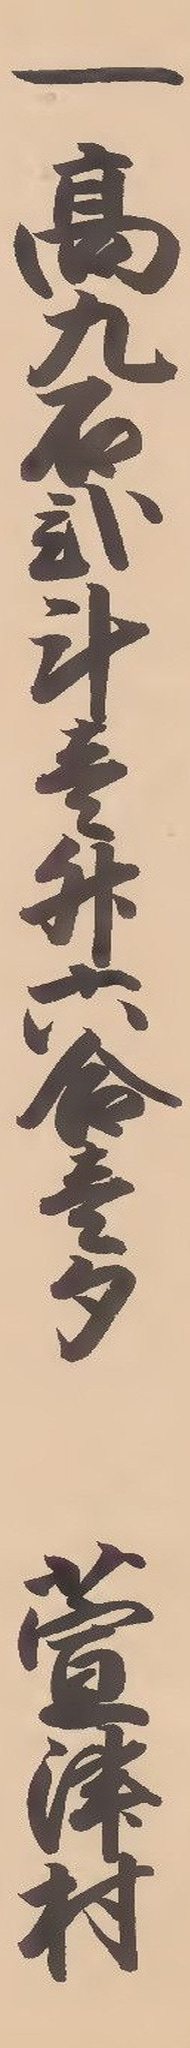一髙九石弐斗壱升六合壱夕萱津村
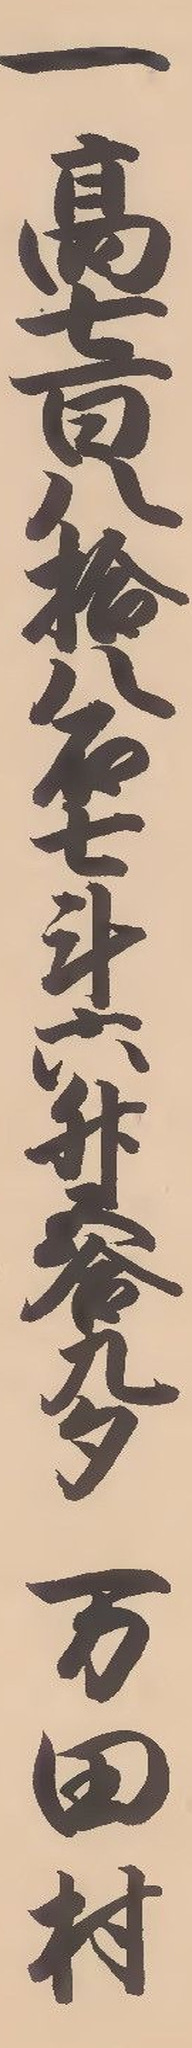一髙七百八拾八石七斗六升五合九夕万田村
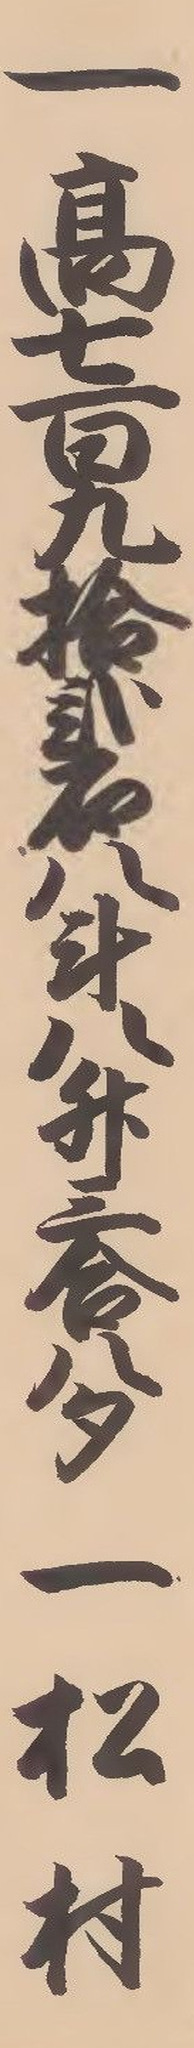一髙七百九拾弐石八斗八升三合八夕一松村
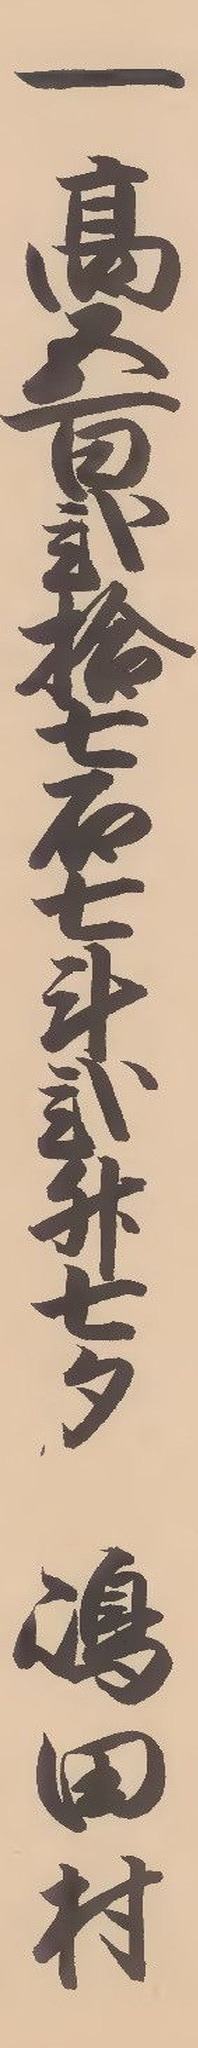一髙五百弐拾七石七斗弐升七夕嶋田村
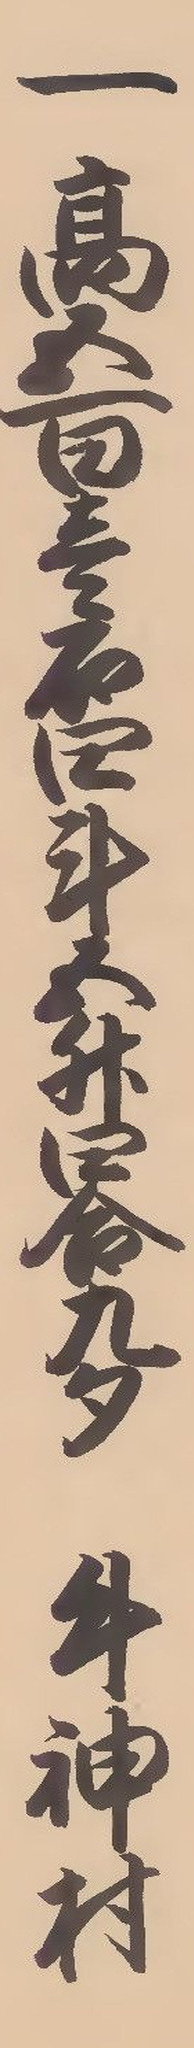一髙五百壱石四斗五升四合九夕牛神村

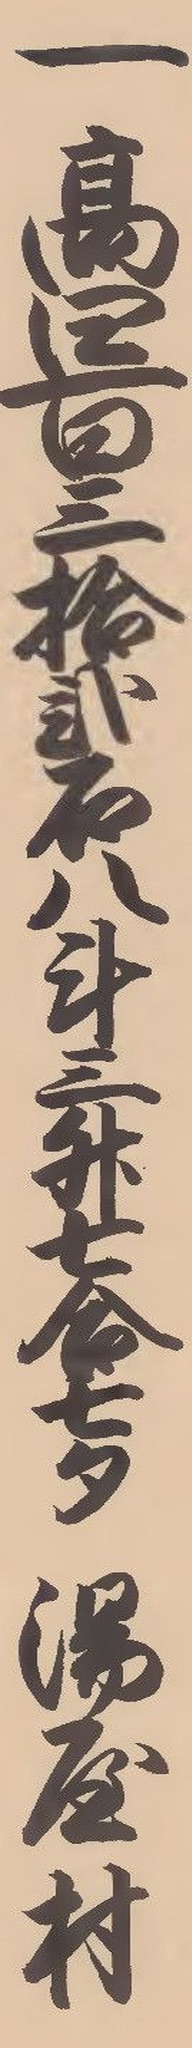一高四百三拾弐石八斗三升七合七夕湯屋村
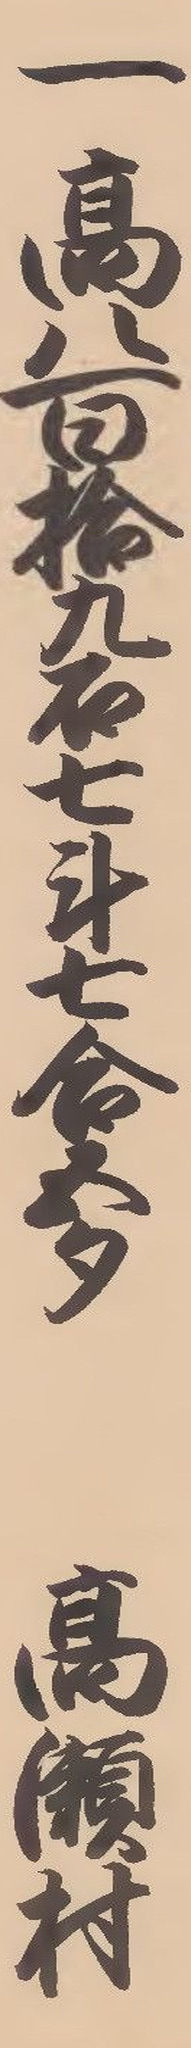一髙八百拾九石七斗七合五夕髙瀬村
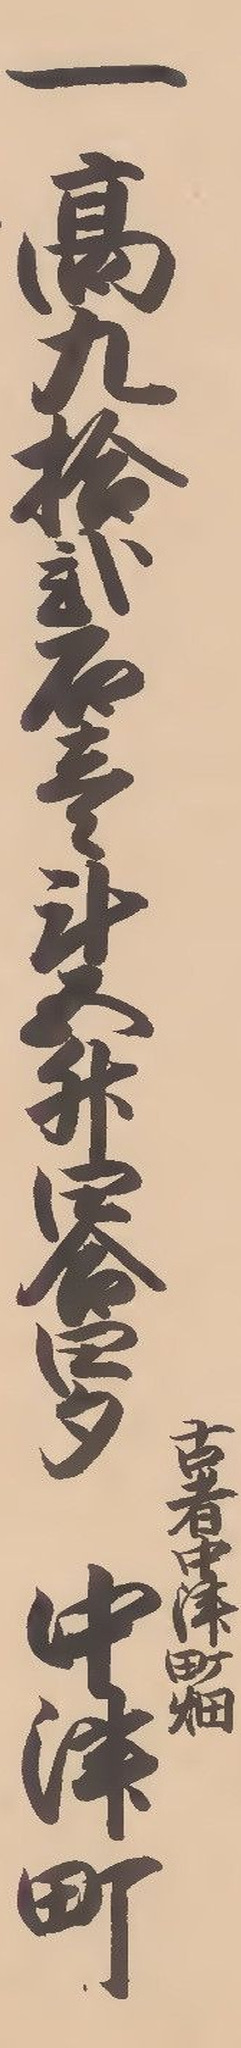一高九拾弐石壱斗五升四合四夕中津町
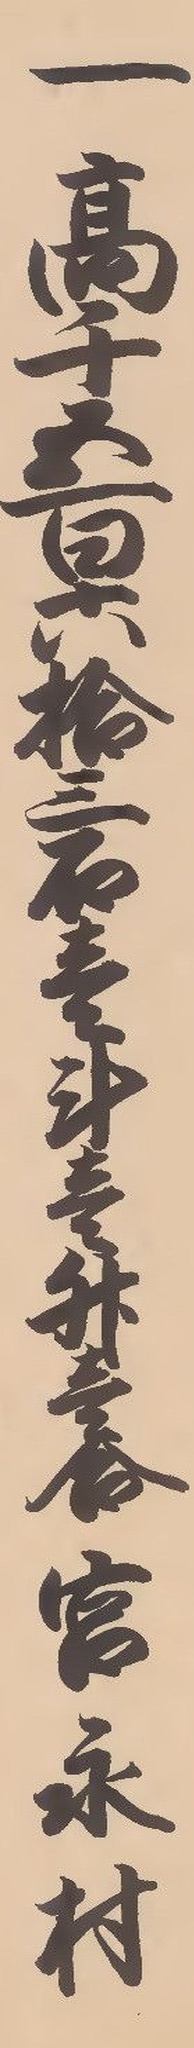一髙千五百六拾三石壱斗壱升壱合宮永村
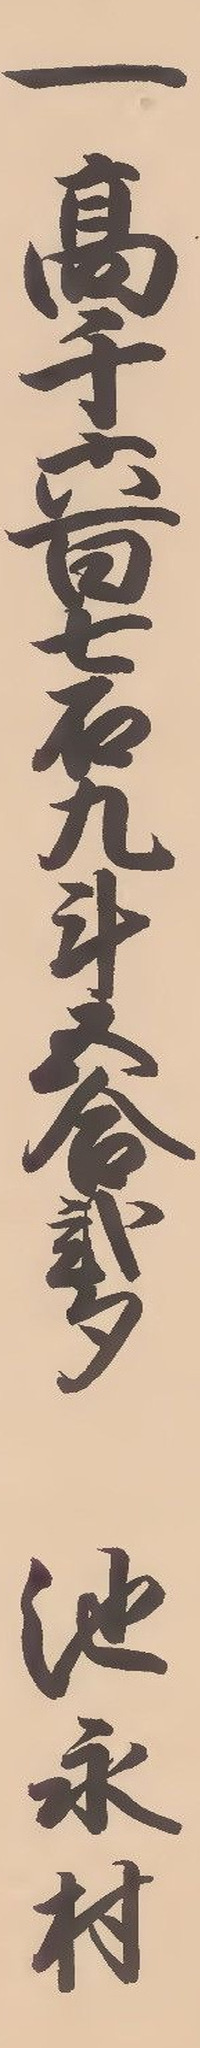一髙千六百七石九斗五合弐夕池永村
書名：豊前国郷帳
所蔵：国立公文書館 National Archives of Japan
